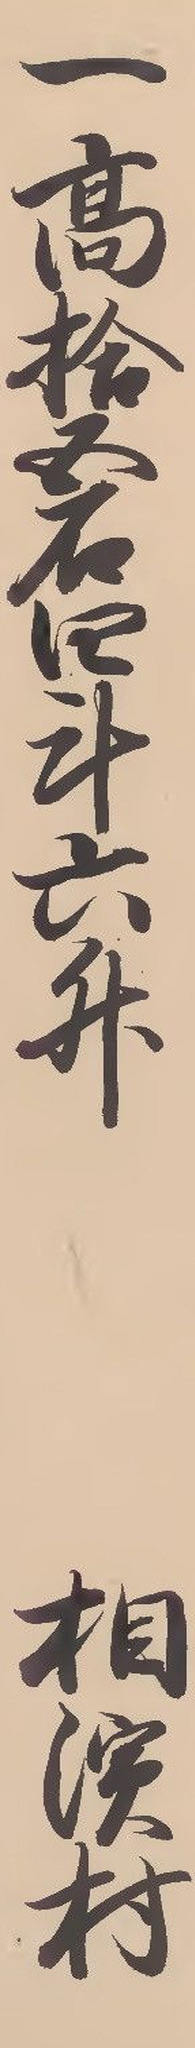一高拾五石四斗六升相浜村
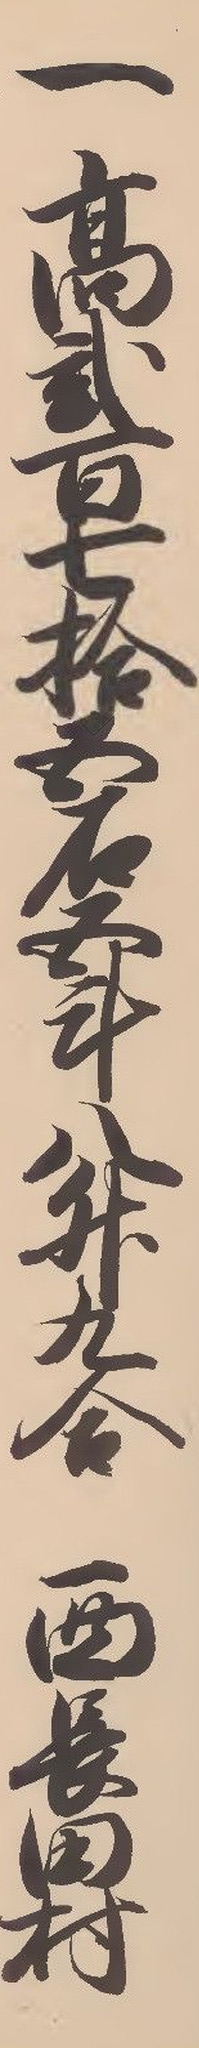一高弐百七拾五石五斗八升九合西長田村
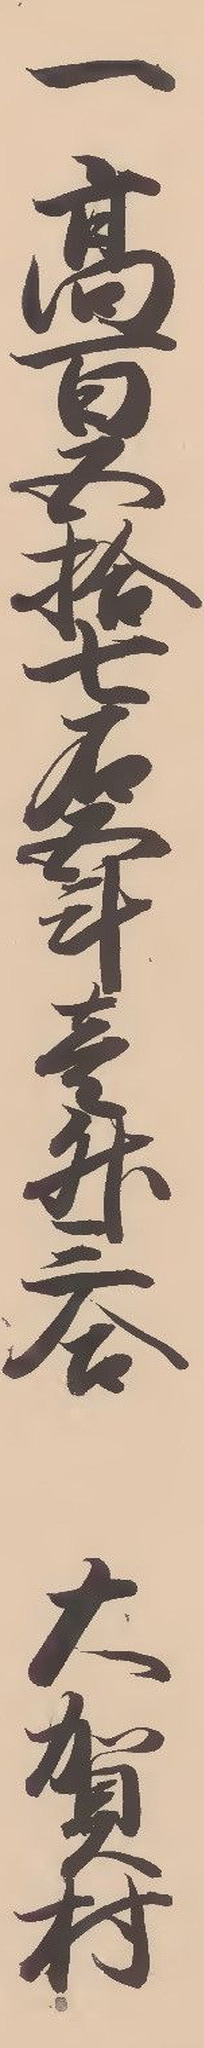一高百五拾七石五斗壱升三合大賀村
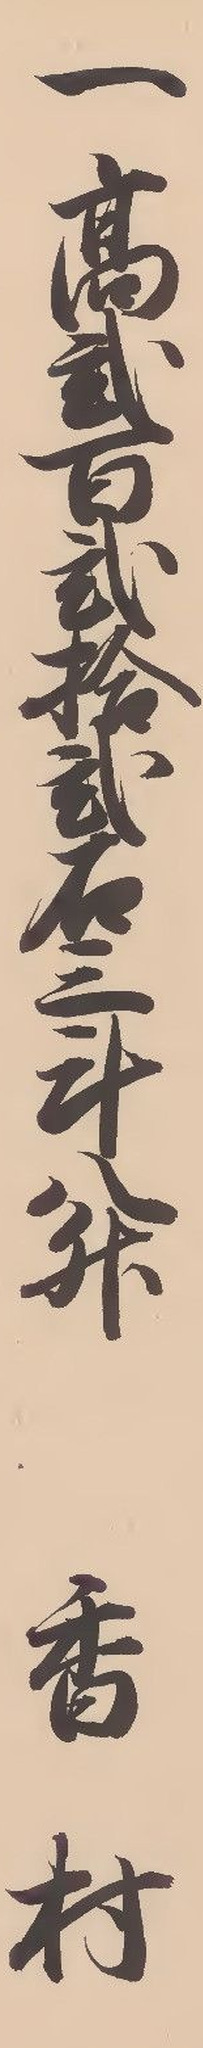一高弐百弐拾弐石三斗八升香村
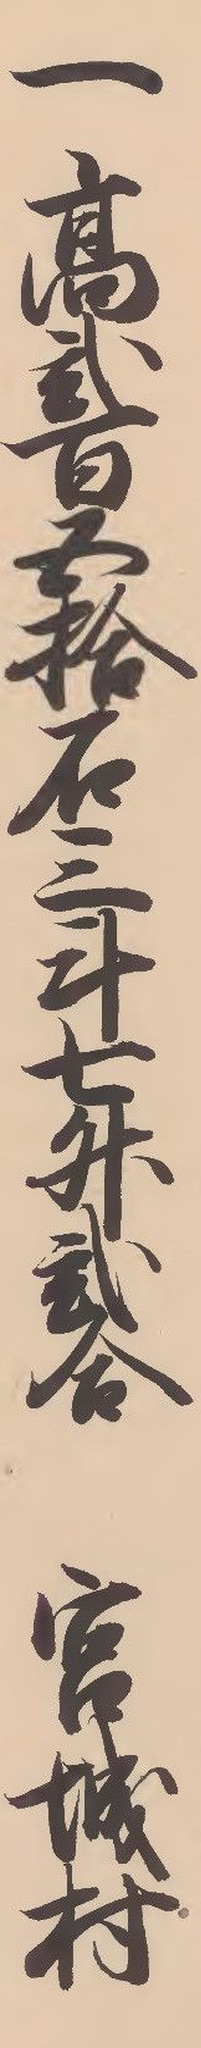一高弐百五拾石三斗七升弐合宮城村

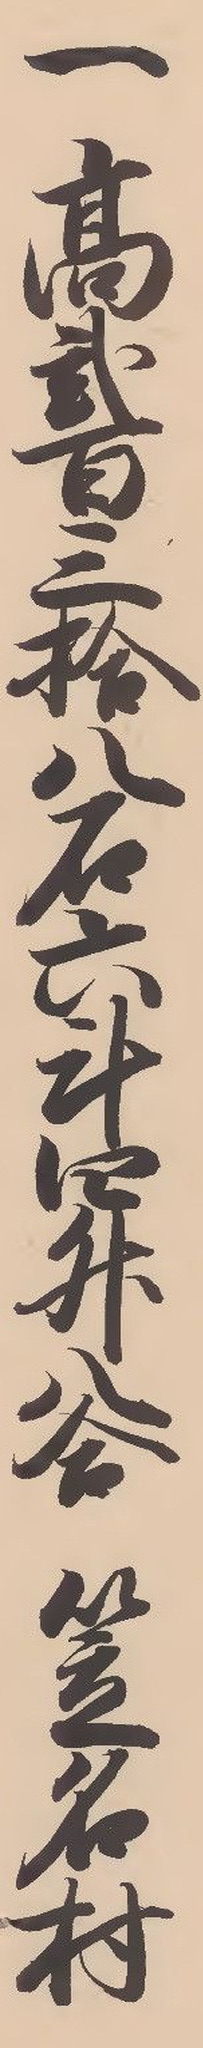一高弐百三拾八石六斗四升八合笠名村
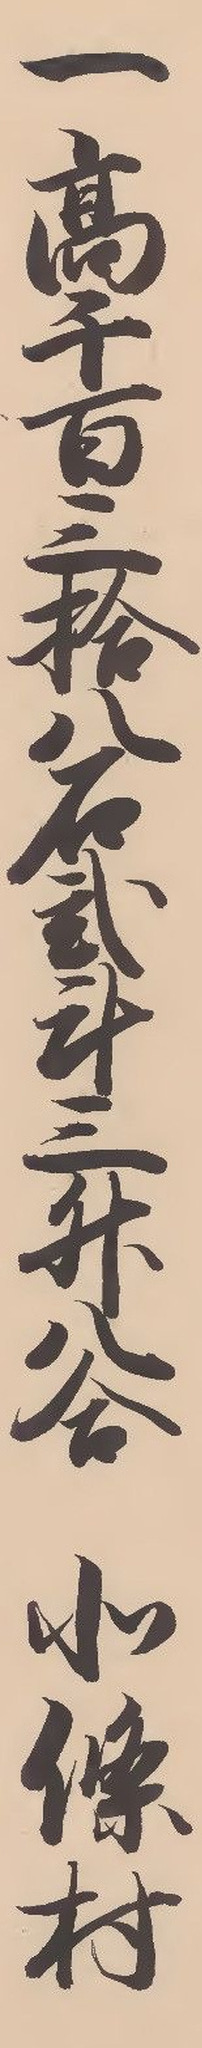一高千百三拾八石弐斗三升八合北条村
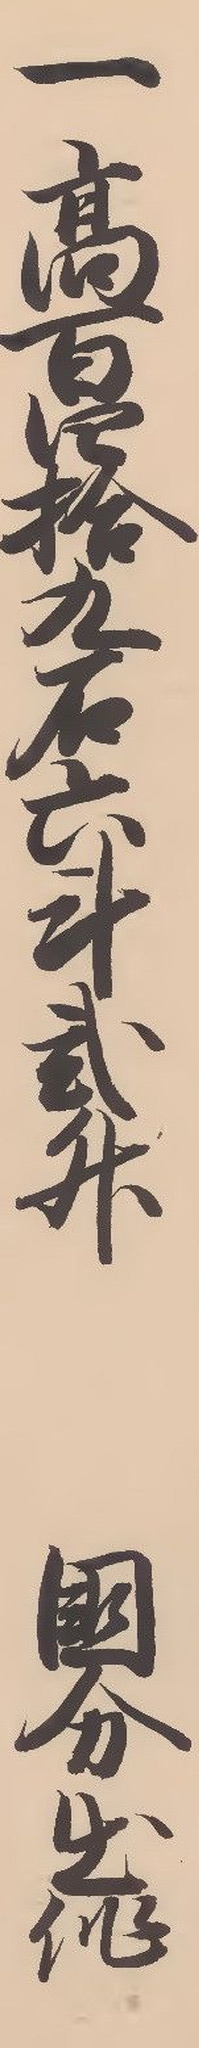一高百四拾九石六斗弐升国分出作
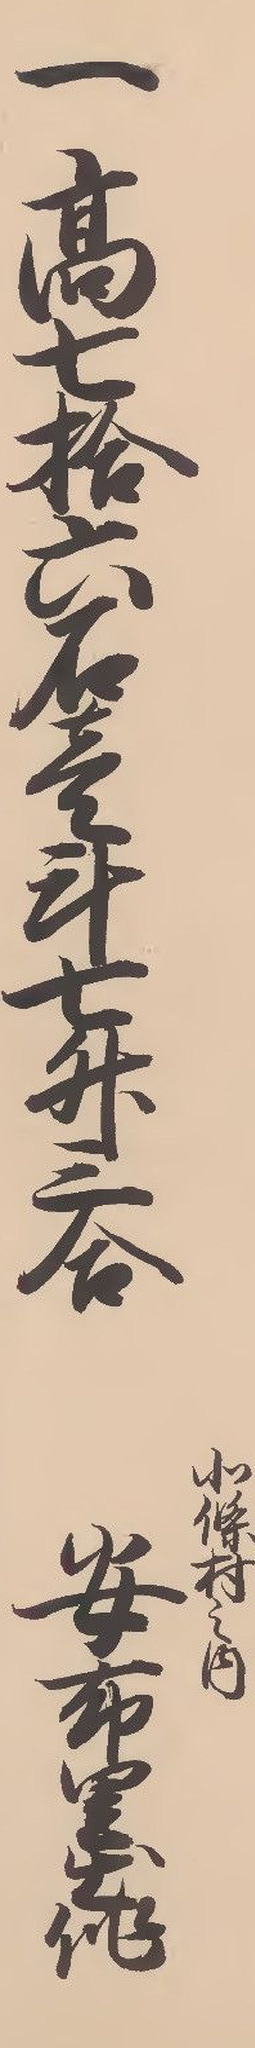一高七拾六石壱斗七升三合安布里出作
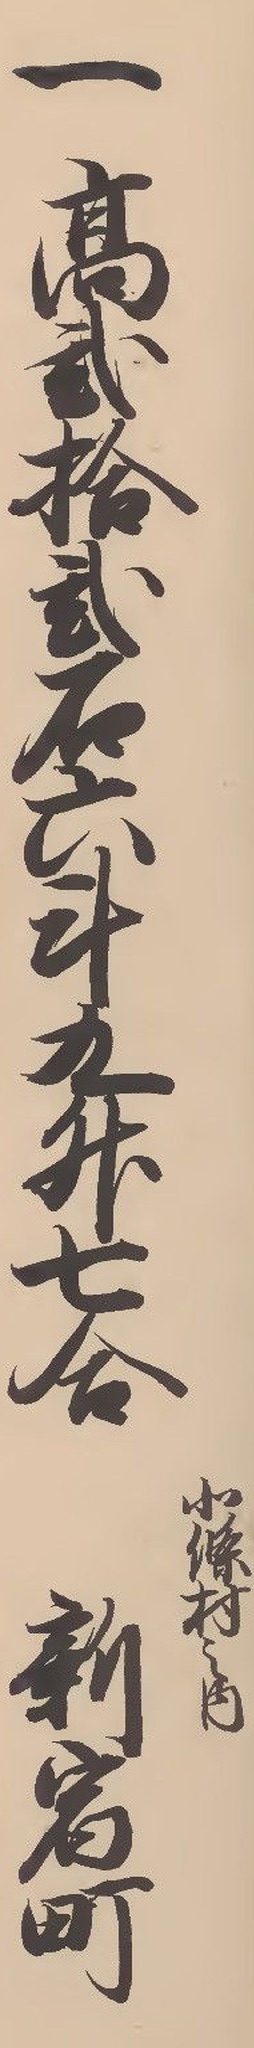一高弐拾弐石六斗九升七合新宿村
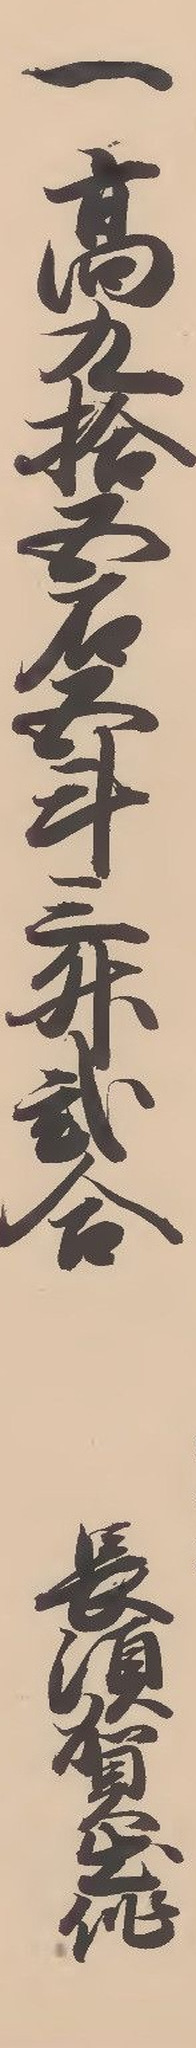一高九拾五石五斗三升弐合長須賀出作
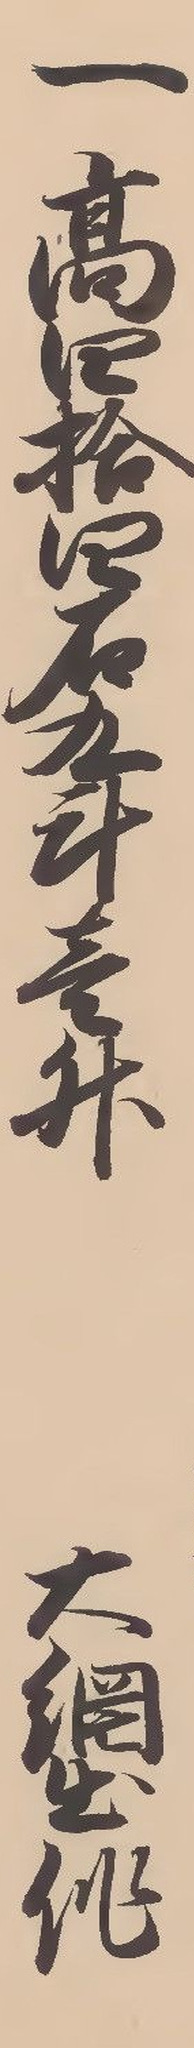一高四拾四石九斗壱升大網出作
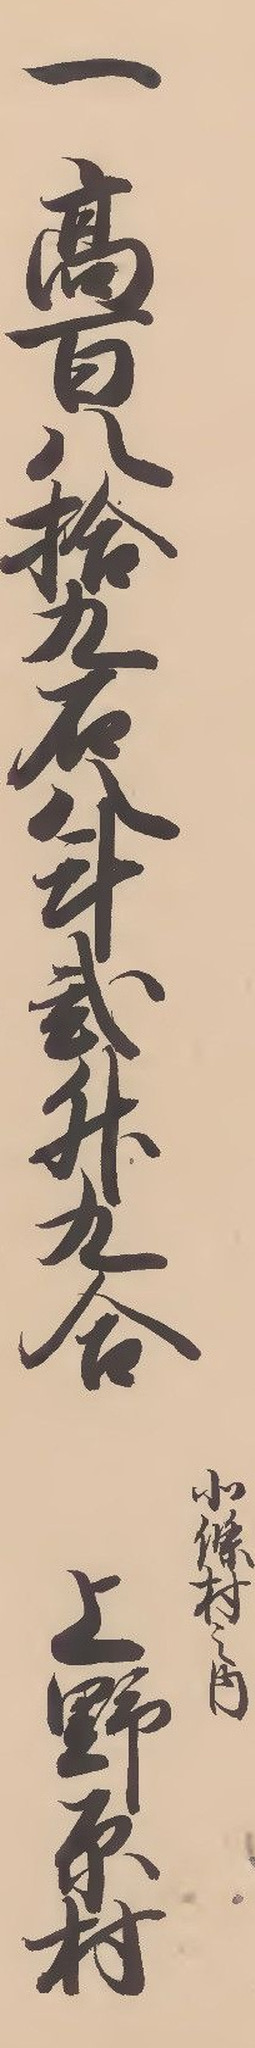一高百八拾九石八斗弐升九合上野原村

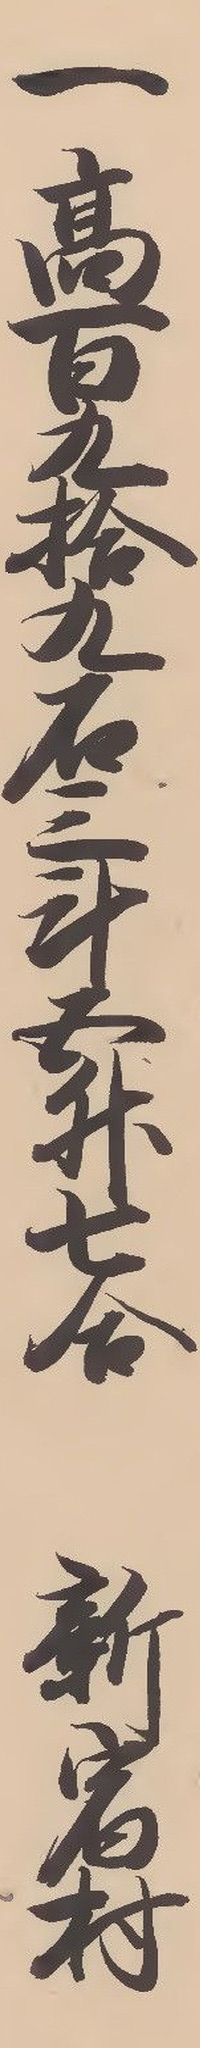一高百九拾九石三斗五升七合新宿村
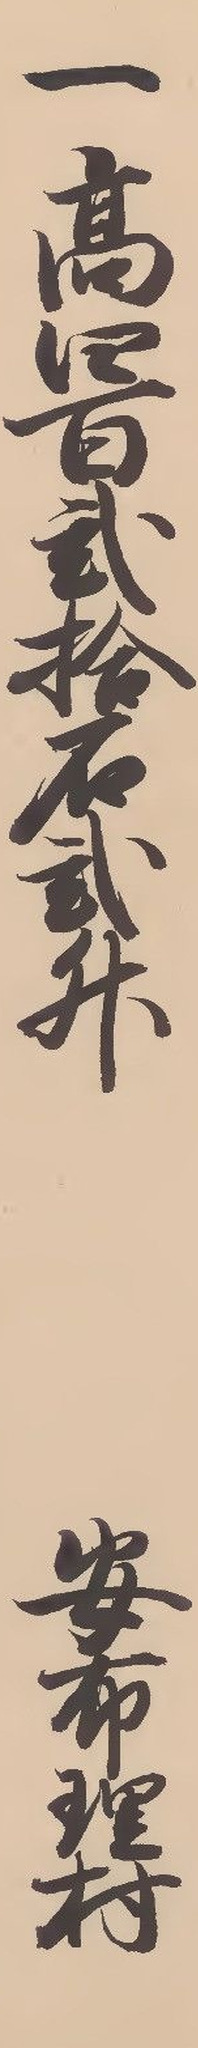一高四百弐拾石弐升安布理村
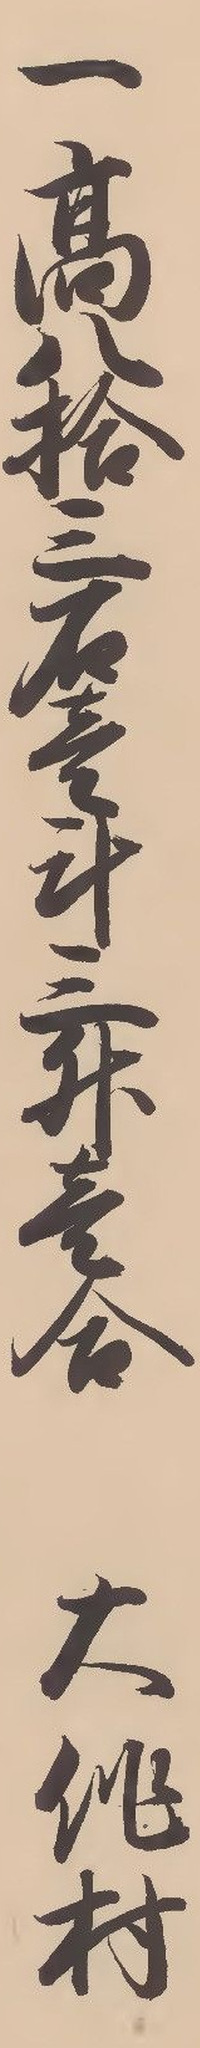一高八拾三石壱斗三升壱合大作村
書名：安房国郷帳
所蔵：国立公文書館 National Archives of Japan
